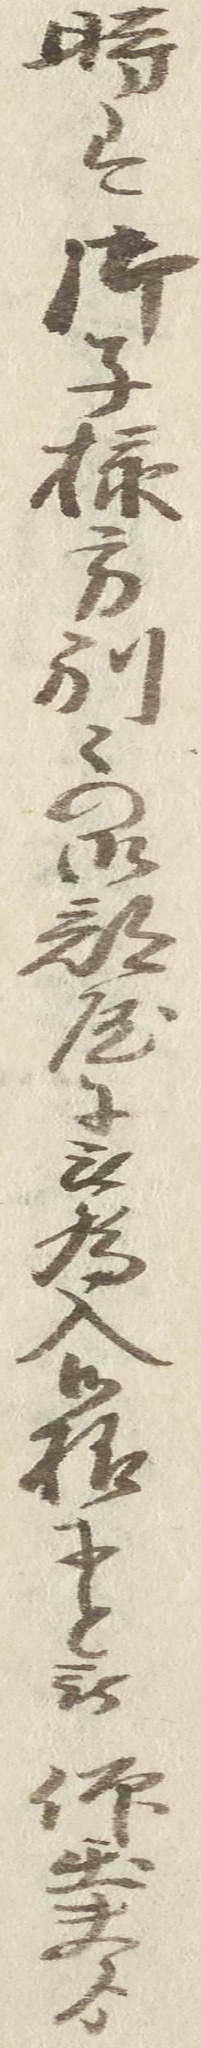時」は御子様方別々の御部屋に被為入候様にと被仰出夫ゟ
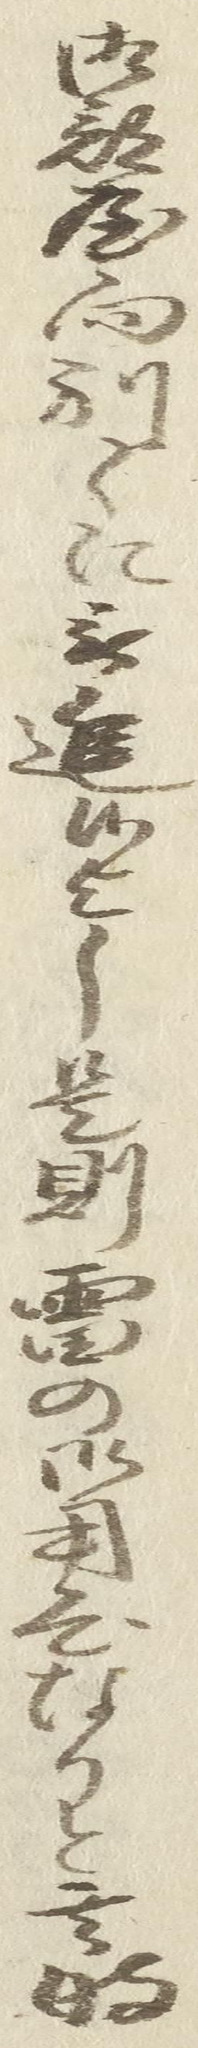御部屋向別々に被進候よし是則雷の御用意なりと其時
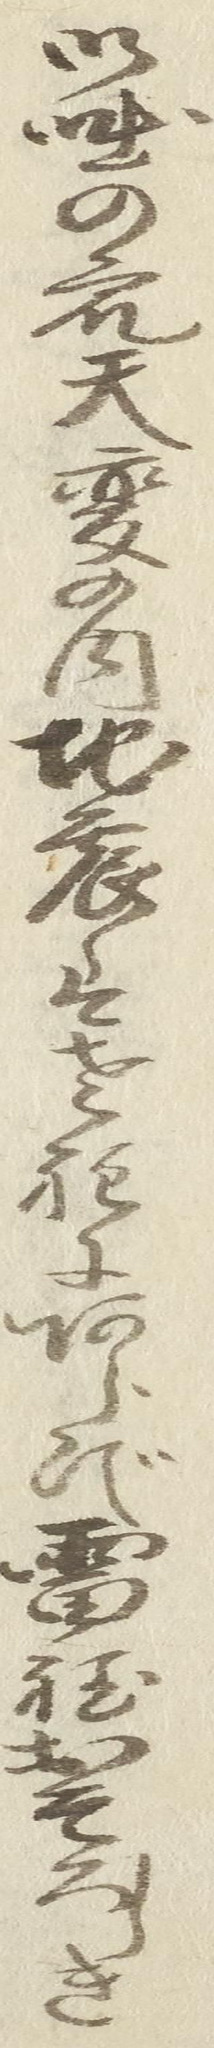御咄の衆天変の内地震は左程にあらず雷程おそろしき
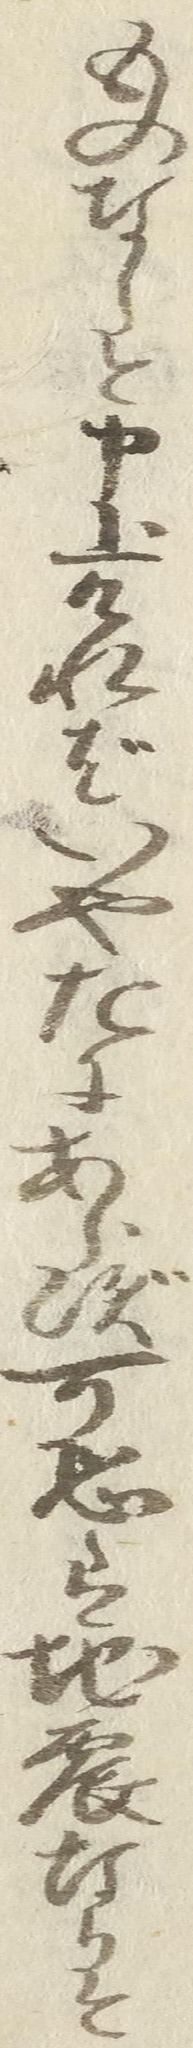ものなしと申上ければいやたにあらず可恐は地震なりと
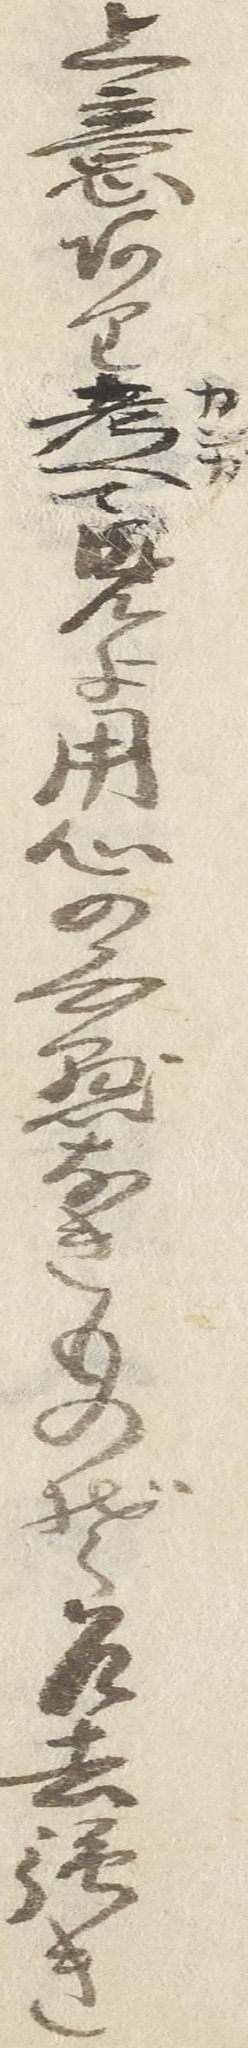上意あり考へ見よ用心の心懸なきものばら乍去強き
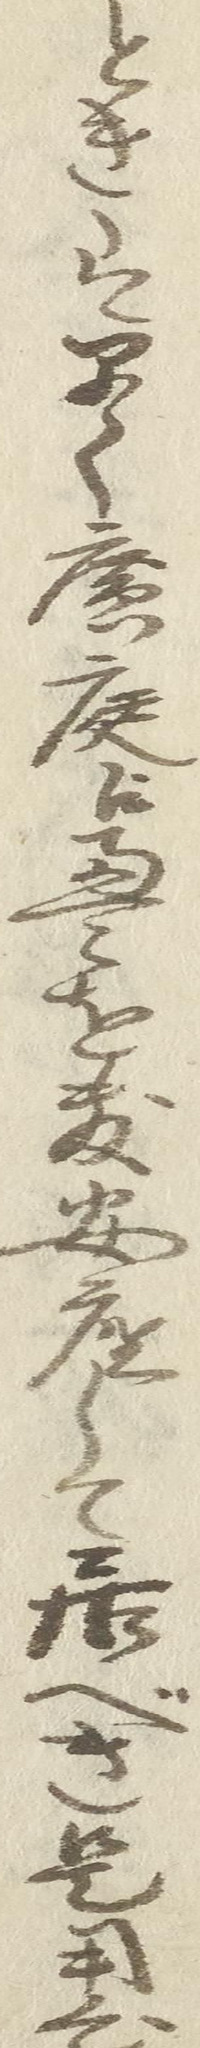ときは早く廣庭江畳を敷安座して居べき是用心

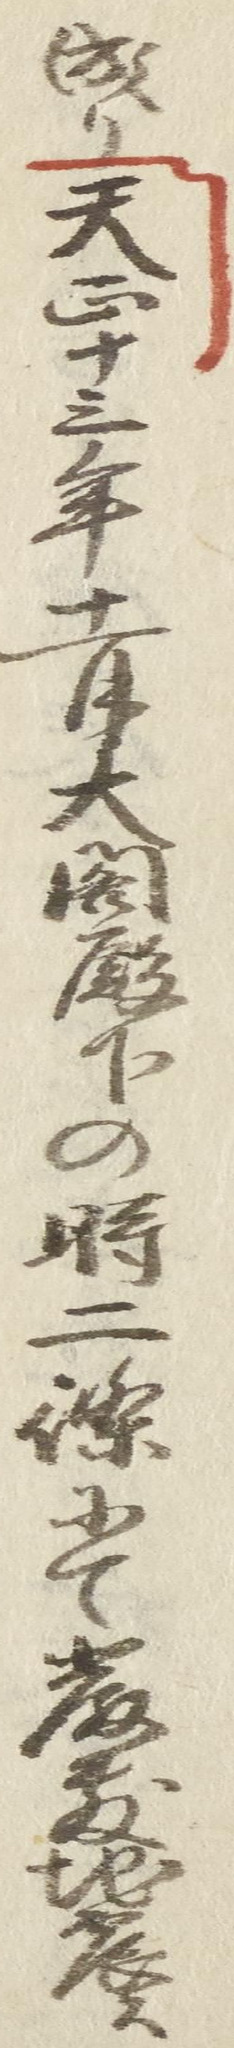成り天正十三年十一月太閤殿下の時二条にて厳敷地震候
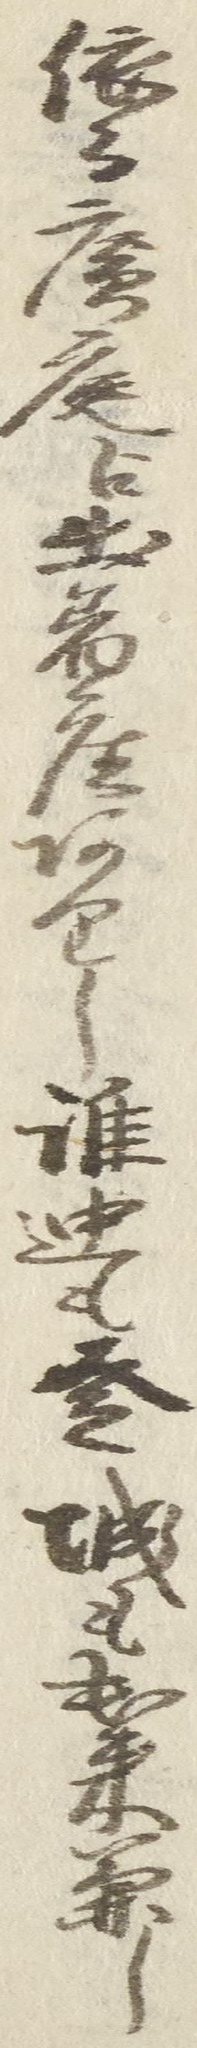依而広庭江出着座ありし誰迚も登城も出来兼し
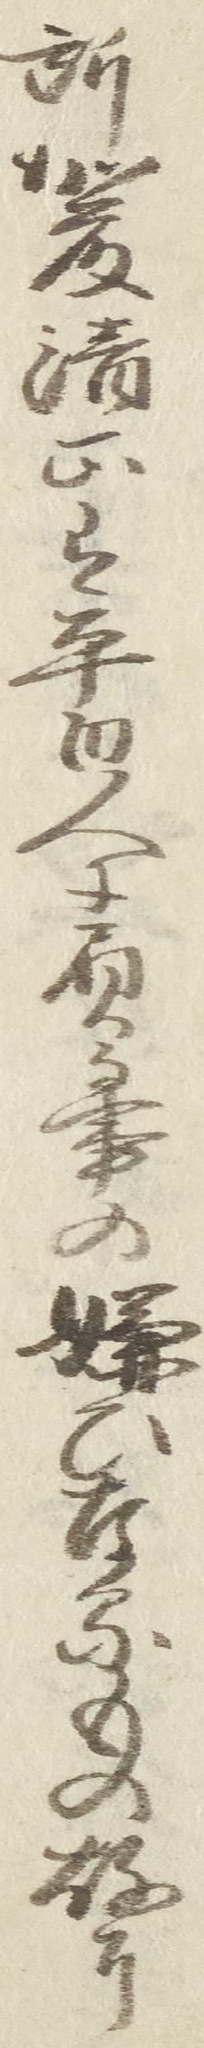所加藤清正は平日人に負る事の嫌ひなるもの故に
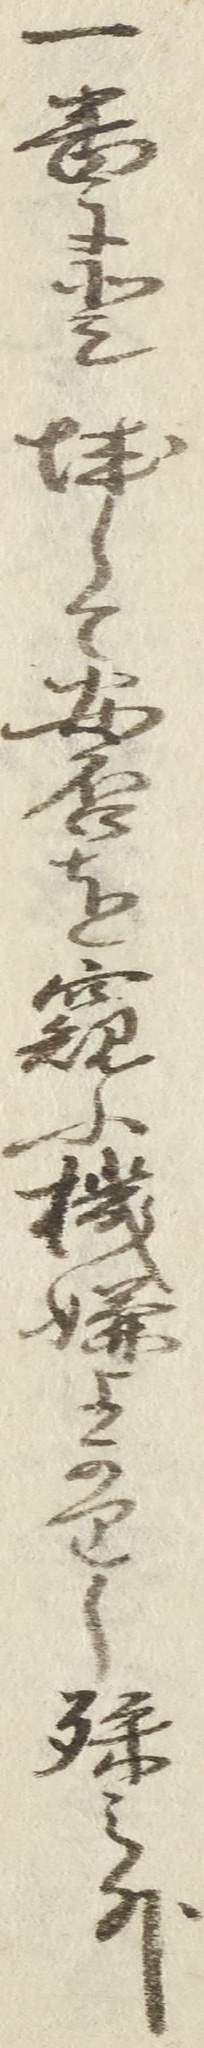一番に登城して安否を窺ふ機嫌よかりし殊之外
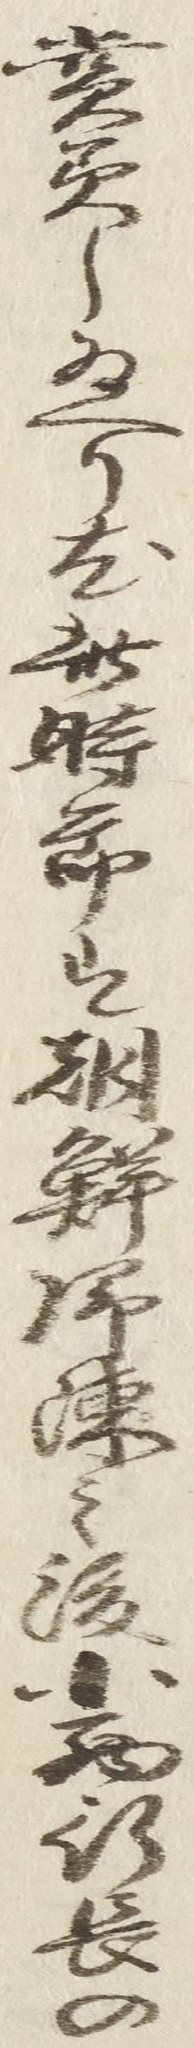賞美し給へり尤此時節は朝鮮帰陣之後小西行長の
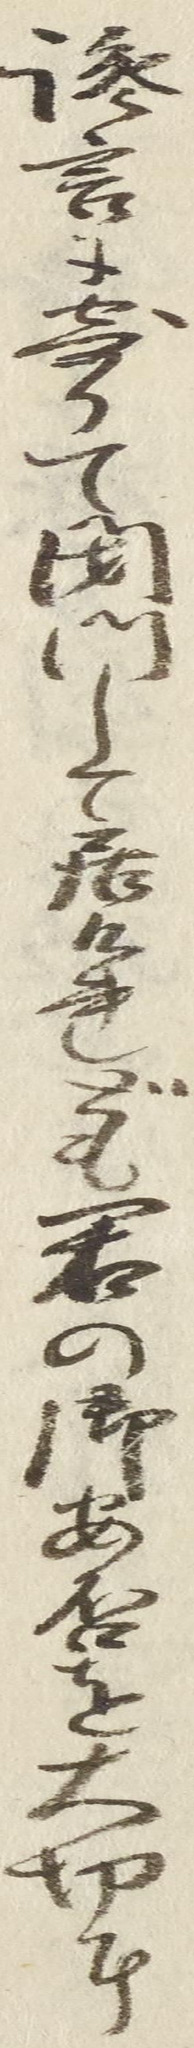讒言に寄りて閉門して居けれども君の御安否を大切に
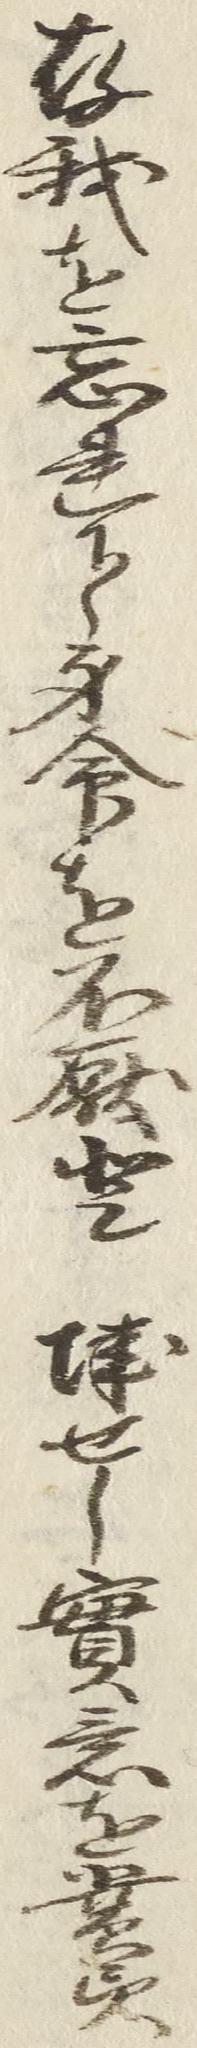存我を忘れて身命を不厭登城せし実意を賞美
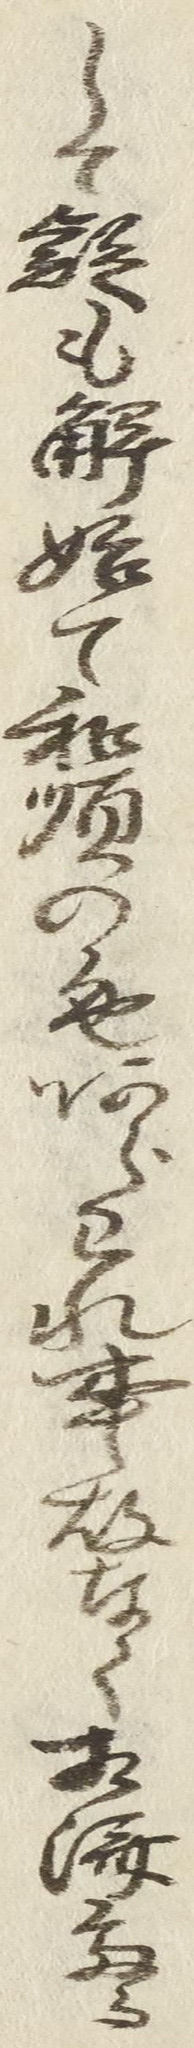して疑も解始て和順の色あらわれ事故なく相済たる
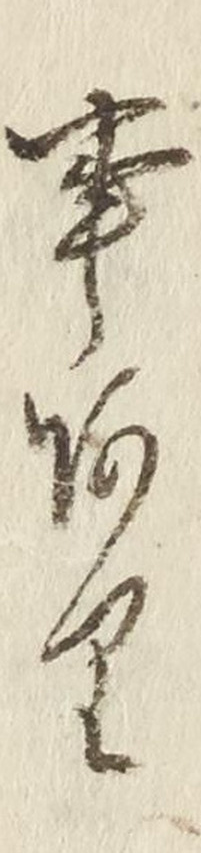事あり
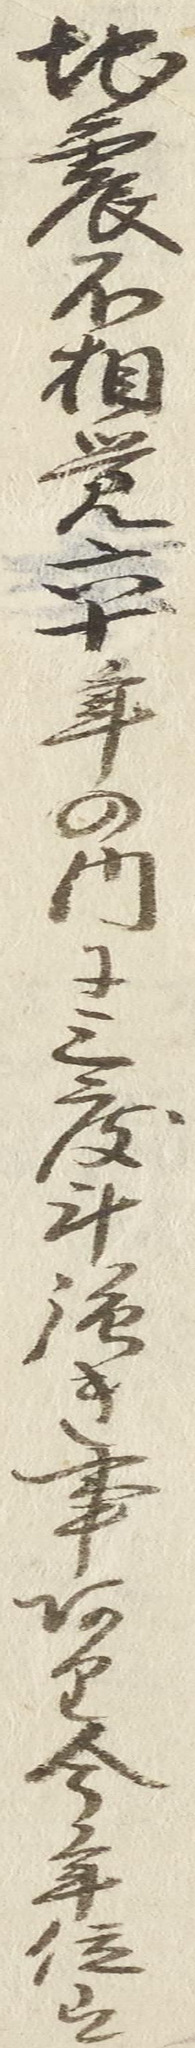地震不相覚六十年の内に三度計強き事あり今年位は
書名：従往古地震御届書記誌之一
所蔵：東京大学地震研究所図書室 Earthquake Research Institute Library, The University of Tokyo, JAPAN
